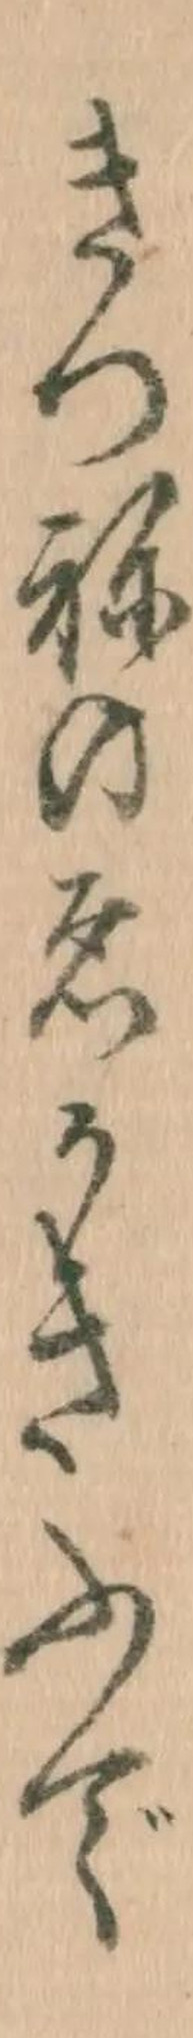きつねのゑかきふで
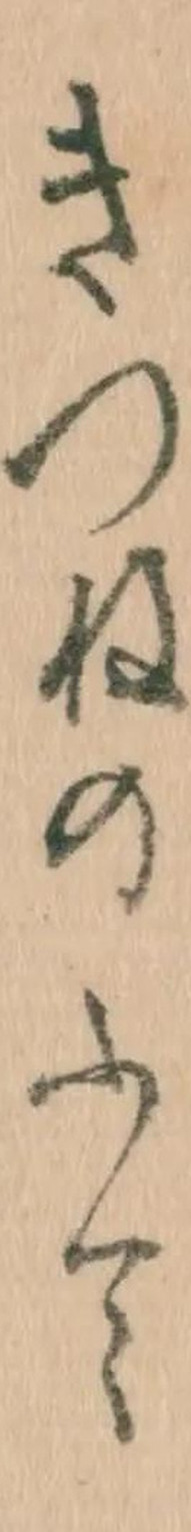きつねのふて
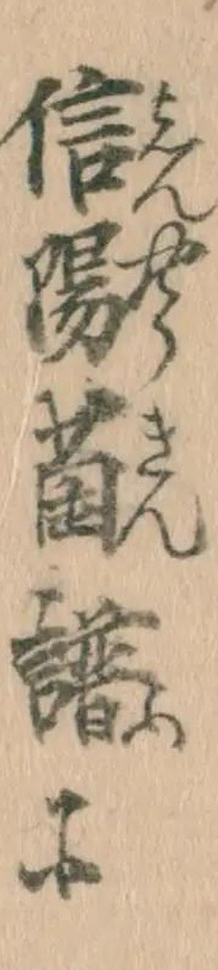信陽菌譜に
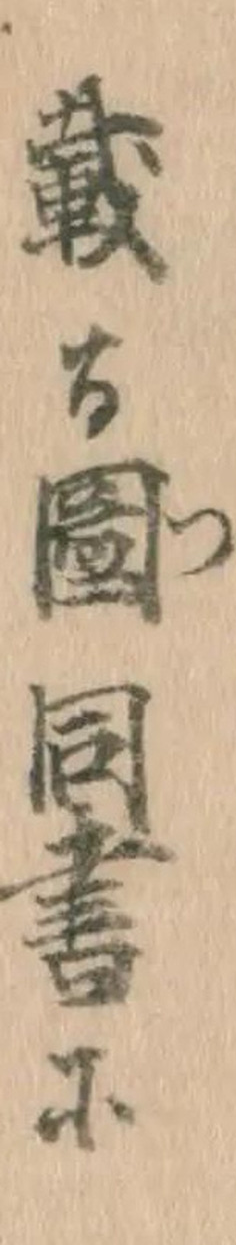載る図同書に
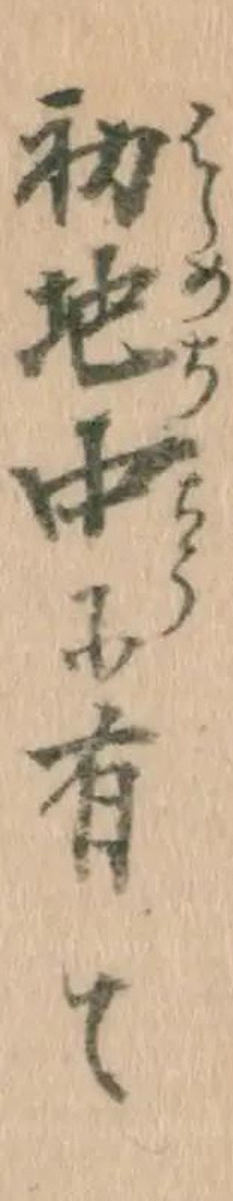初地中に有て
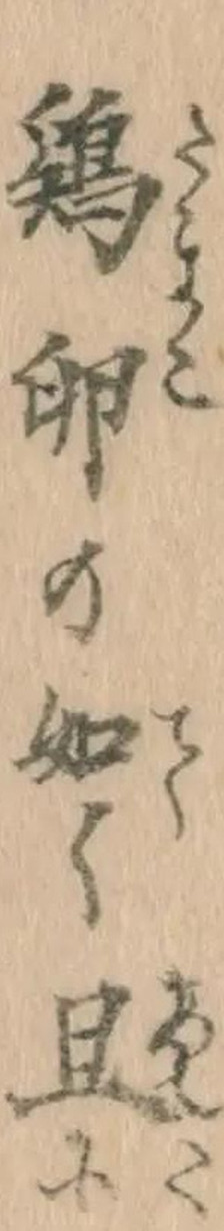鶏卵の如く旦に
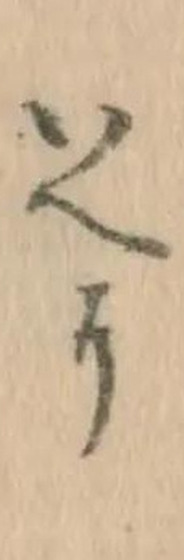いへり

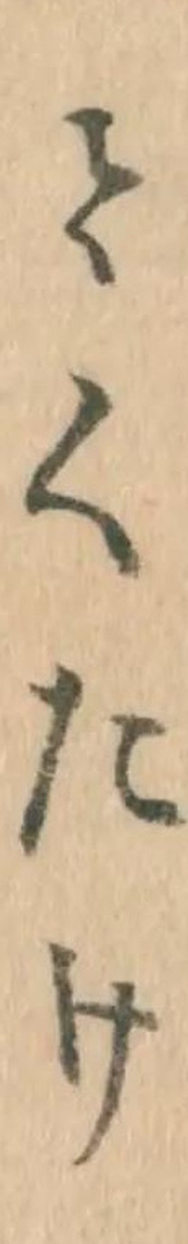とくたけ
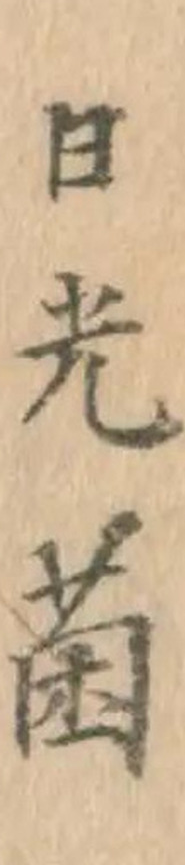日光菌
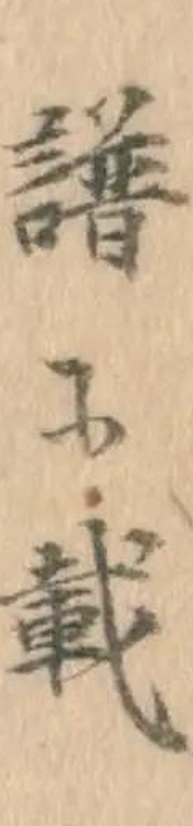譜に載
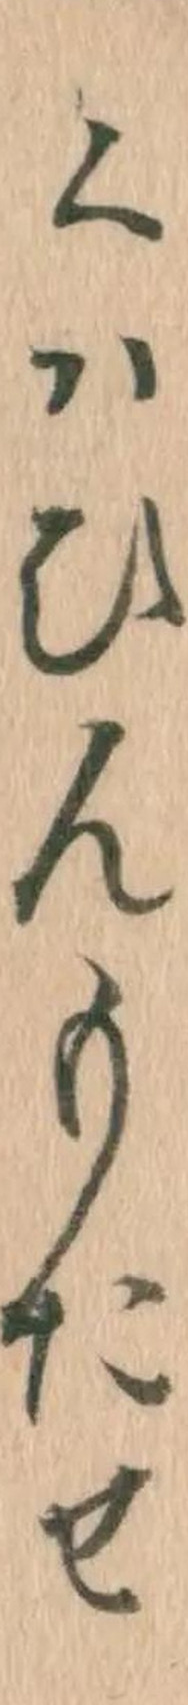くはひんもたせ
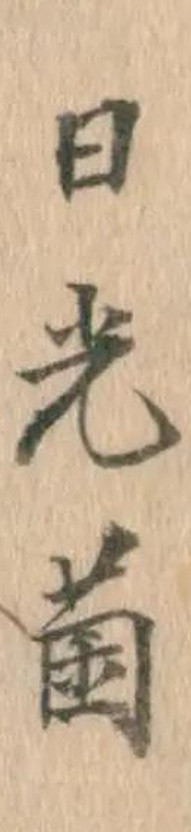日光菌
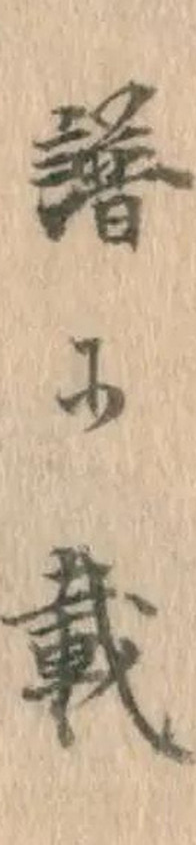譜に載
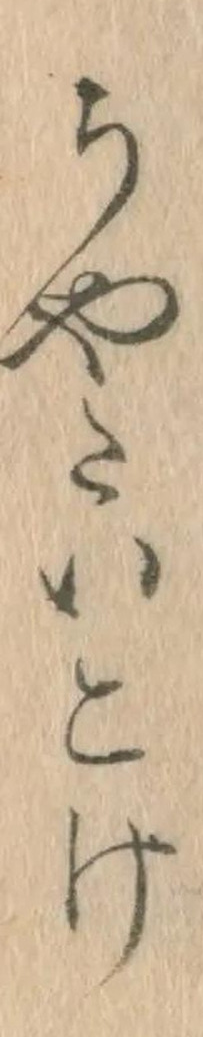ちやたいこけ

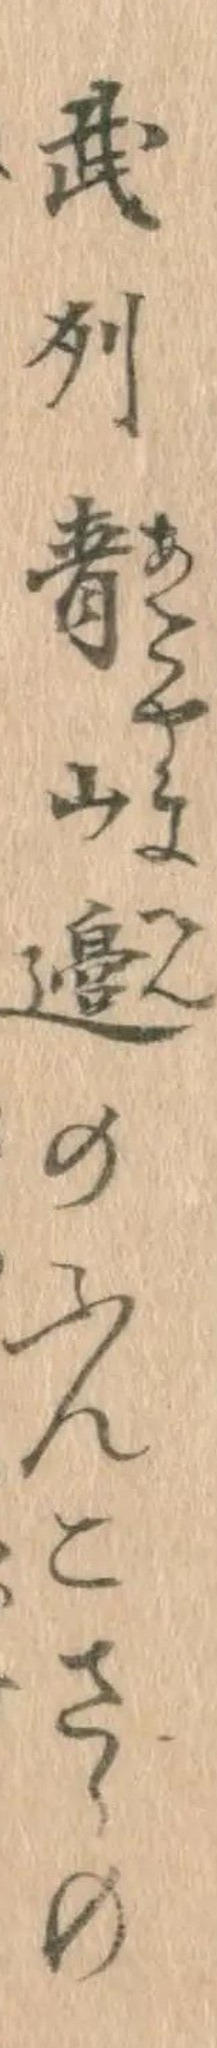武州青山辺のふんこさゝの
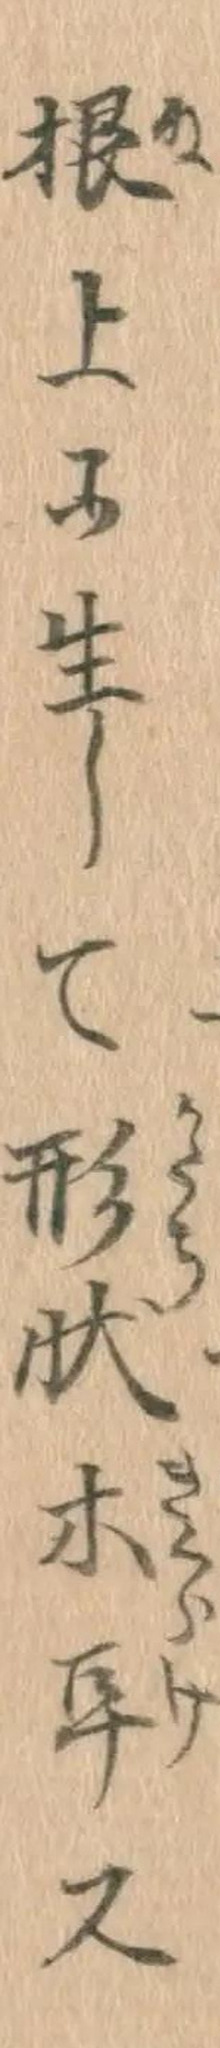根上に生して形状木耳又
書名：本草図譜. 巻58-60
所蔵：国立国会図書館 National Diet Library, JAPAN
